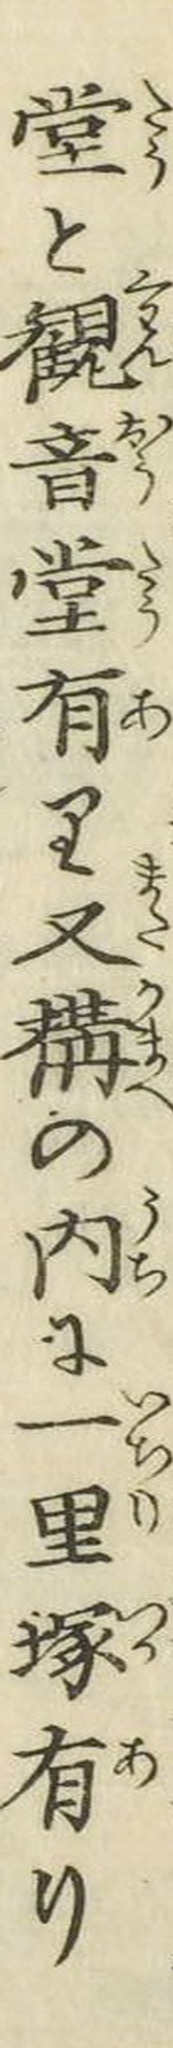堂と観音堂有り又構の内に一里塚有り
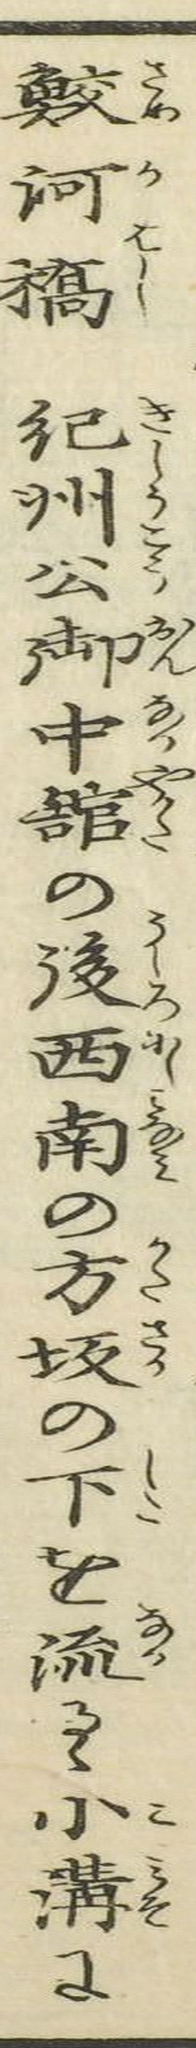鮫河橋紀州公御中館の後西南の方坂の下を流るゝ小溝に
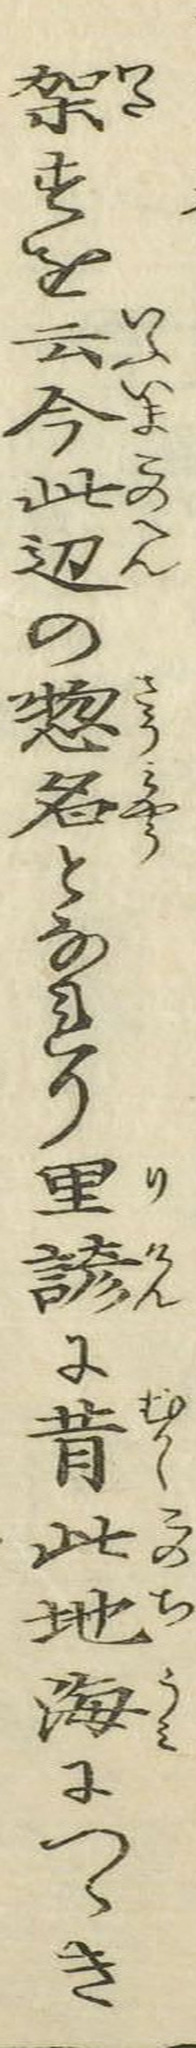架すを云今此辺の惣名となれり里諺に昔此地海につゝき
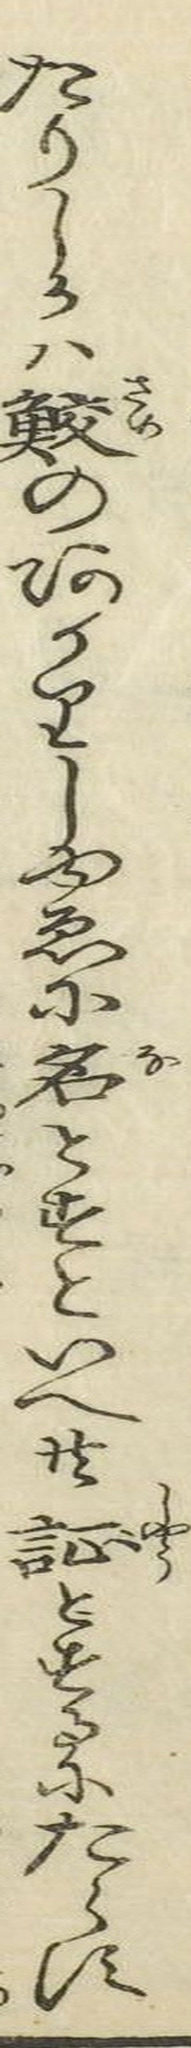たりしかは鮫のあかりしゆゑに名とすといへ共証とするにたらす
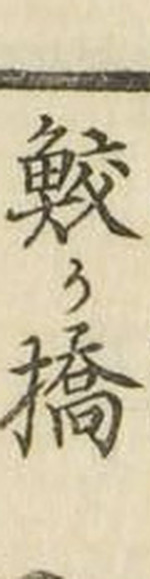鮫か橋
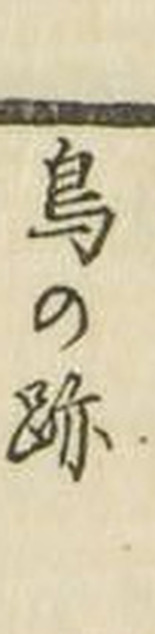鳥の跡
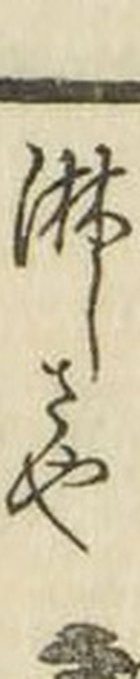淋しさや
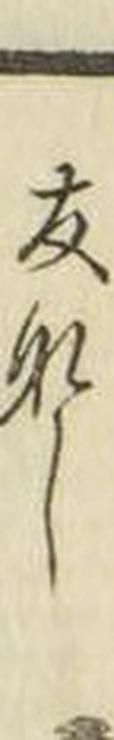友なし
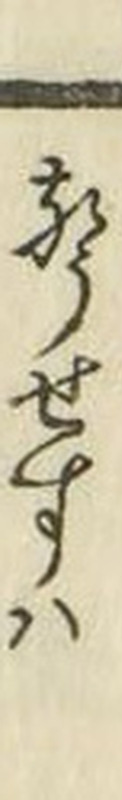声せすは
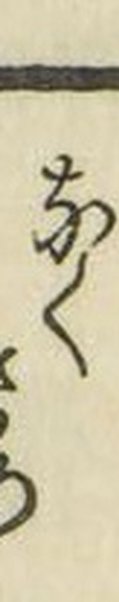なくさめ
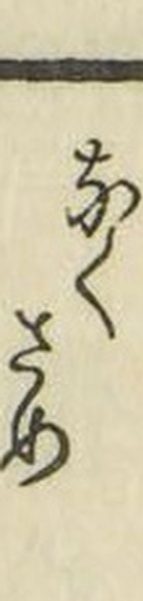なくさめ
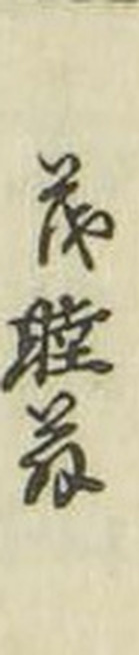茂睦翁

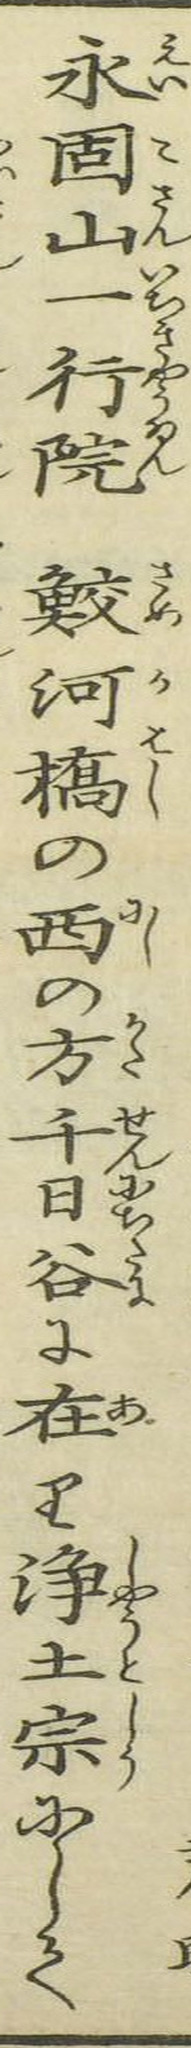永固山一行院鮫河橋の西の方千日谷に在り浄土宗にして
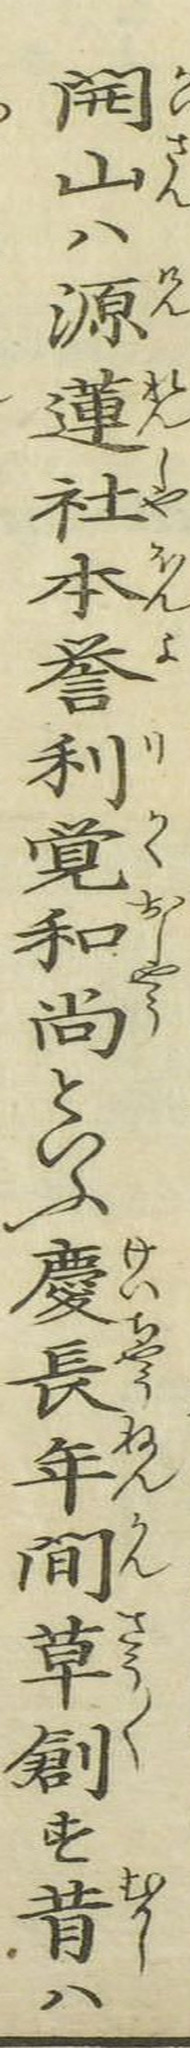開山は源蓮社本譽利覚和尚といふ慶長年間草創す昔は
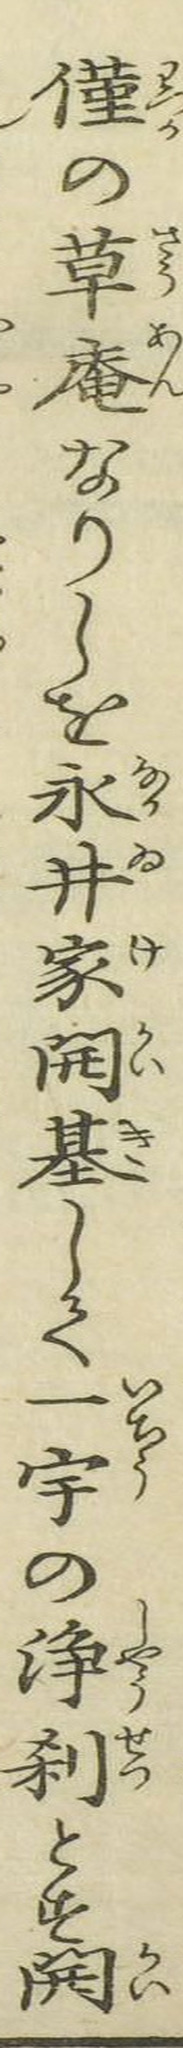僅の草庵なりしを永井家開基して一宇の浄刹とす開
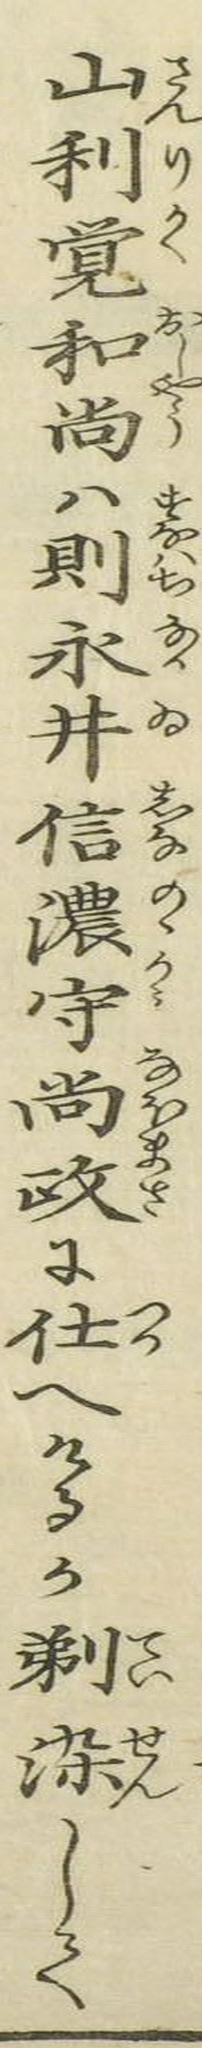山利覚和尚は則永井信濃守尚政に仕へけるか剃染して
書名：江戸名所図会 20巻 巻之9
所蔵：東京学芸大学教育コンテンツアーカイブ
